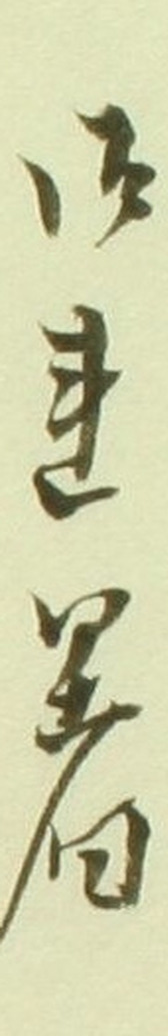御連署
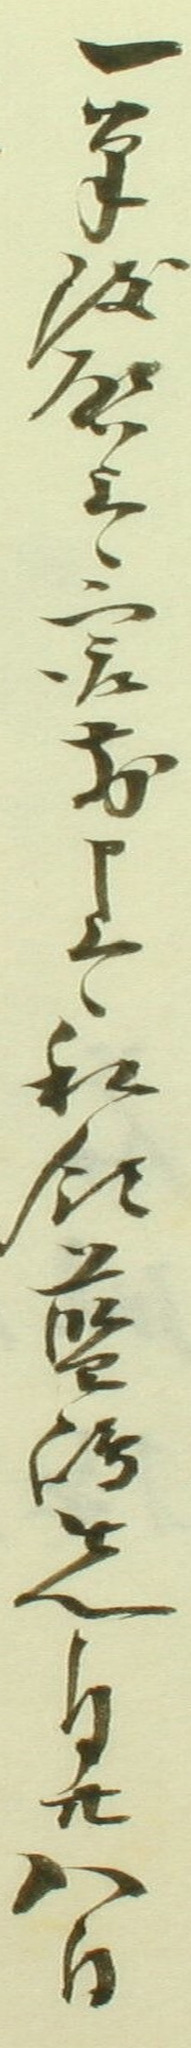一筆致啓上候最前申上候私領藍嶋先月廿八日
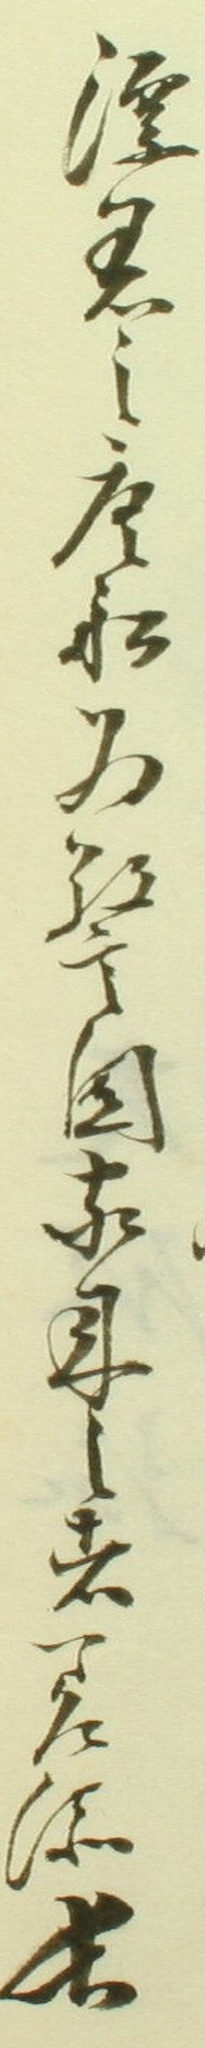漂着之唐船為警固家来之者差添長
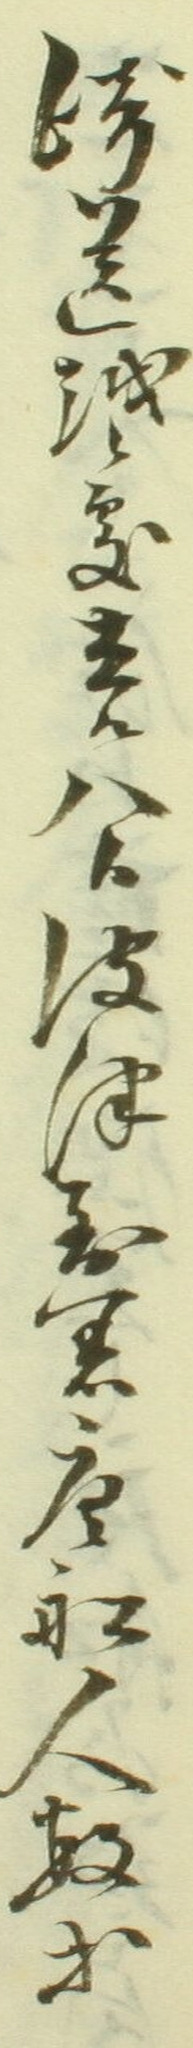崎送越候処去ル八日彼津到着唐船人数等
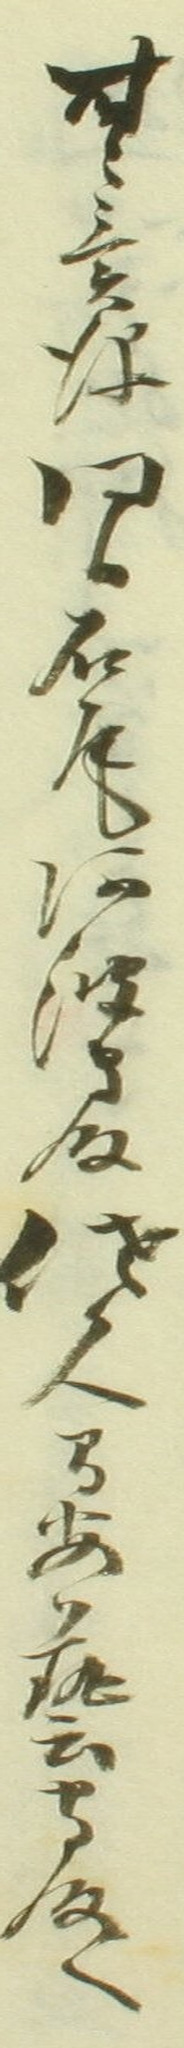無異儀同日石尾阿波守殿佐久間安芸守殿へ
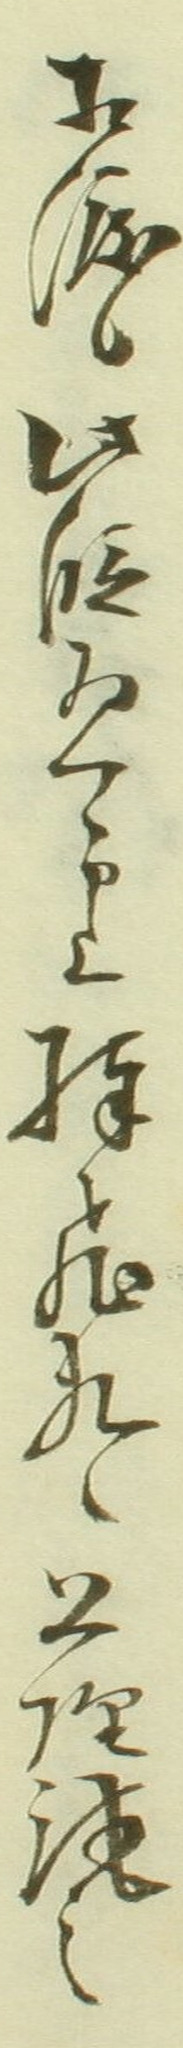相渡候此段為可申上捧飛札恐惶謹言
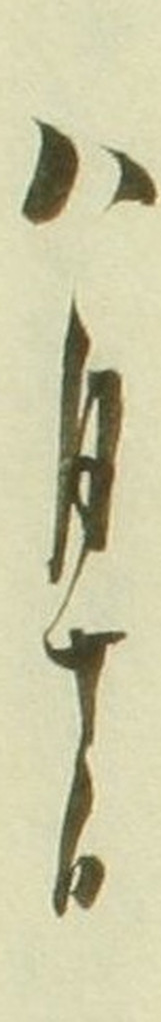八月十日
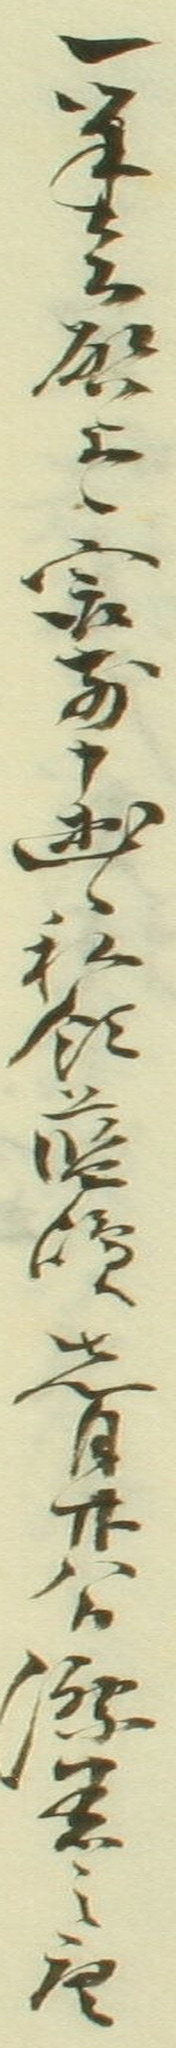一筆令啓上候最前申述候私領藍嶋先月廿八日漂着之唐
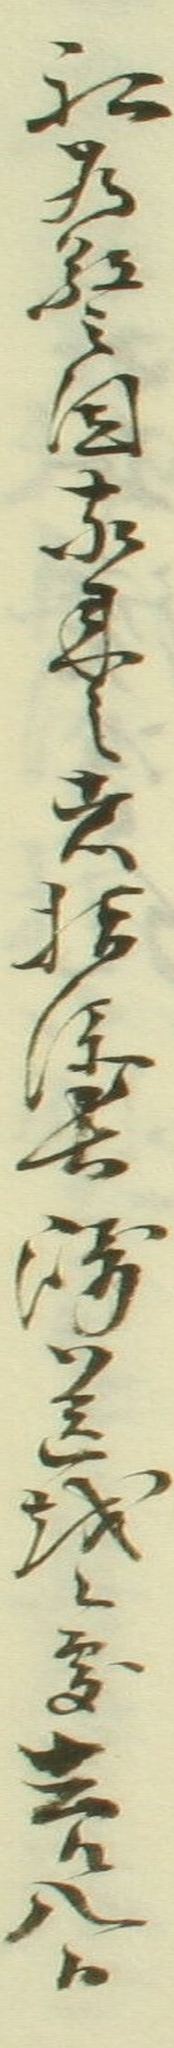船為警固家来之者差添長崎送越候処去ル八日
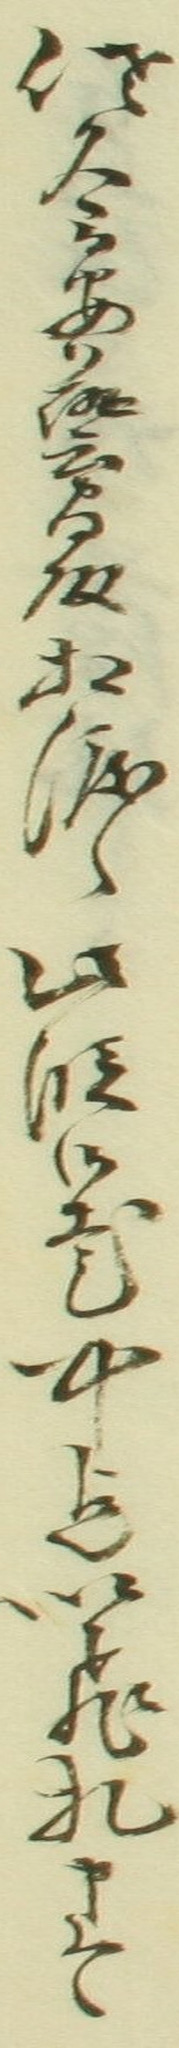佐久間安芸守殿相渡候此段御老中迄以飛札申上候

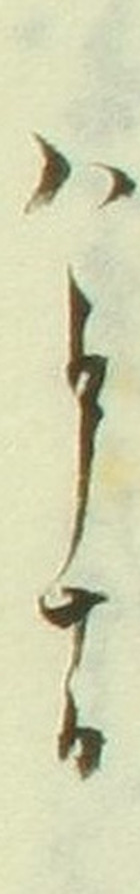八月十日
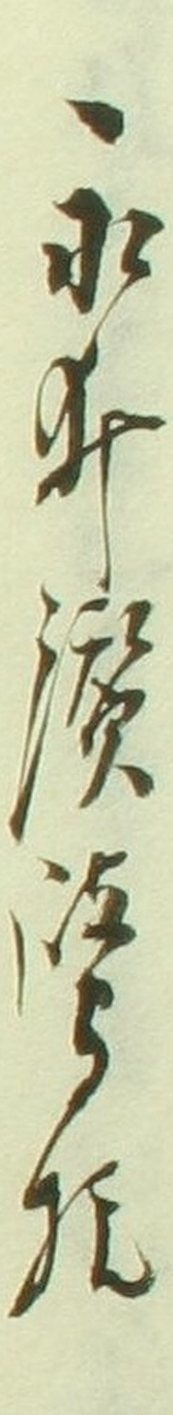永井讃岐守様
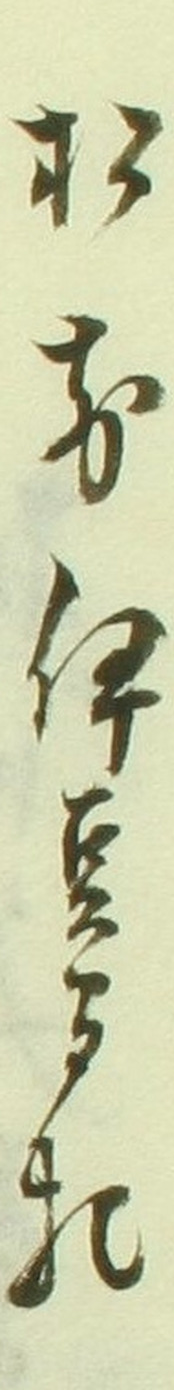松前伊豆守様
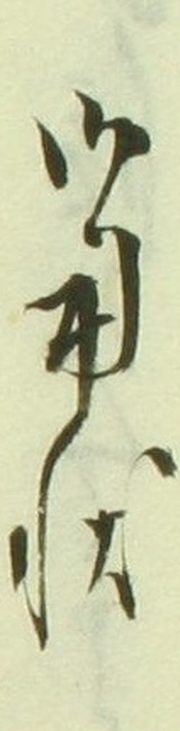御用状
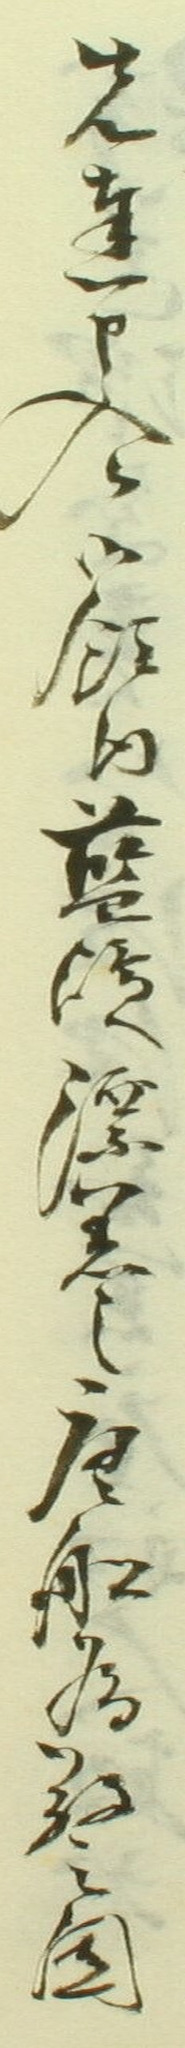先達申入候御領内藍嶋漂着之唐船為警固
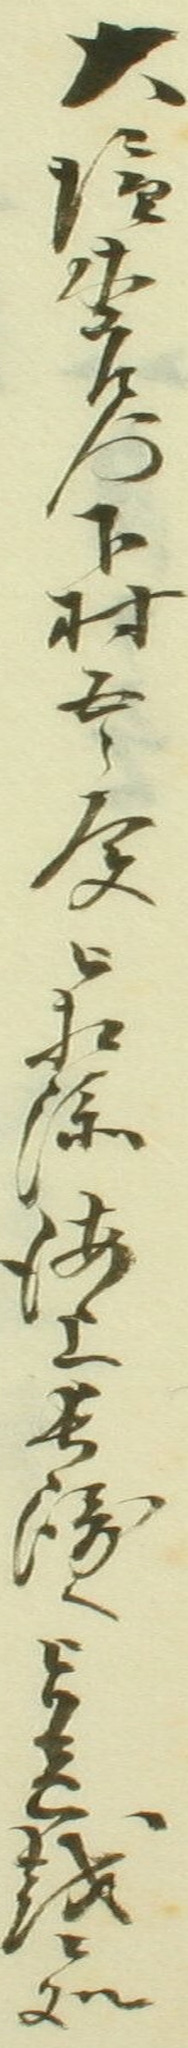大塩杢左衛門下村五郎太夫被相添海上長崎へ被送越候処
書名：異国船漂着記
